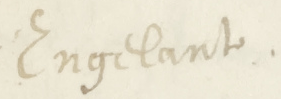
Engelant.
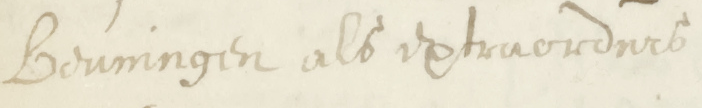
Beuningen als extraordnrs
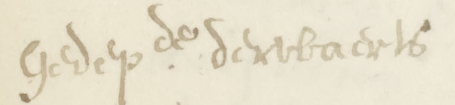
Gedepde. derwaerts
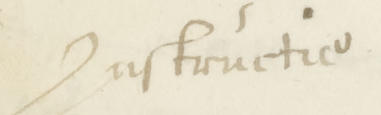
Instructie
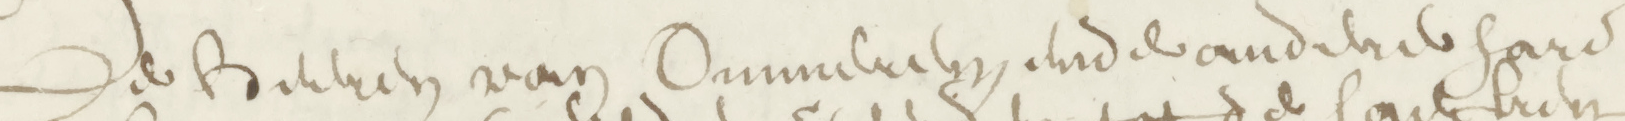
De Heeren van Ommeren, ende andere hare
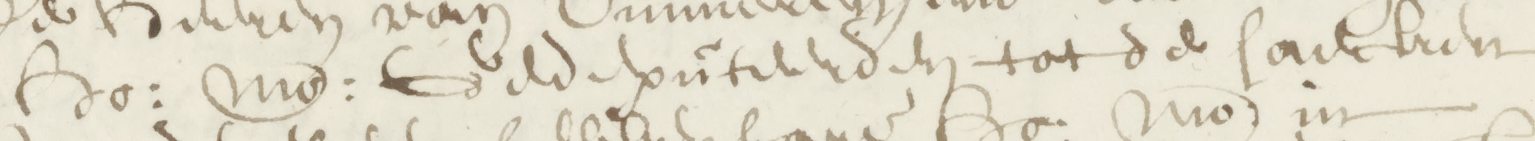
Ho:Mo: Gedeputeerden tot de saecken
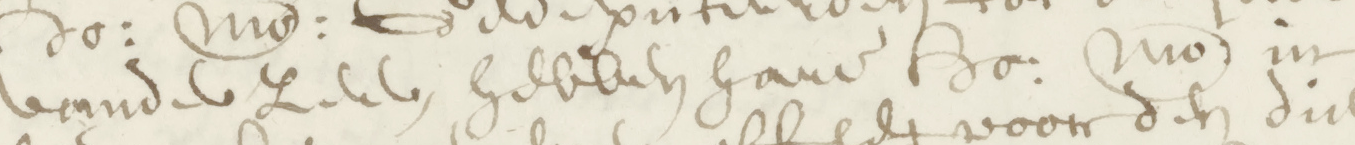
vande Zee, hebben hare Ho:Mo: in
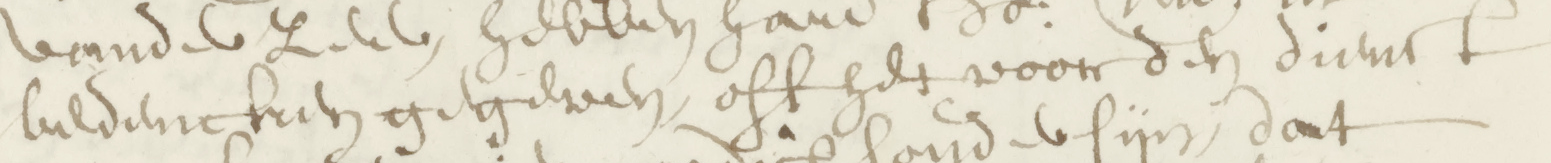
bedencken gegeven, off het voor den dienst
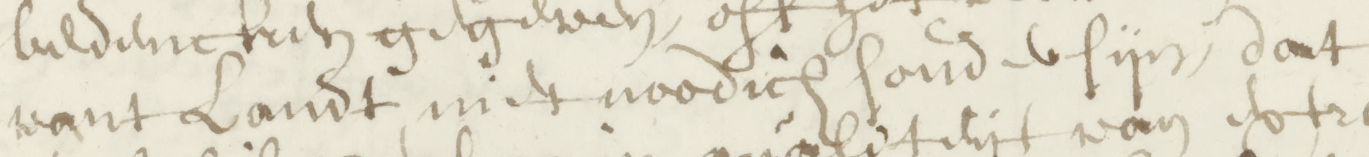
vant Landt niet noodich soude sijn, dat
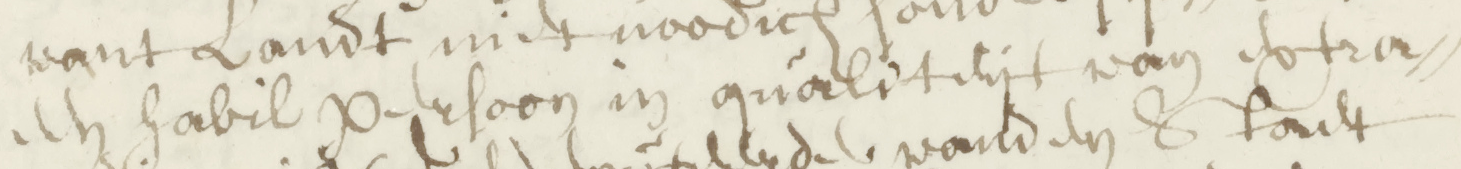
een habil persoon in qualiteijt van extra„
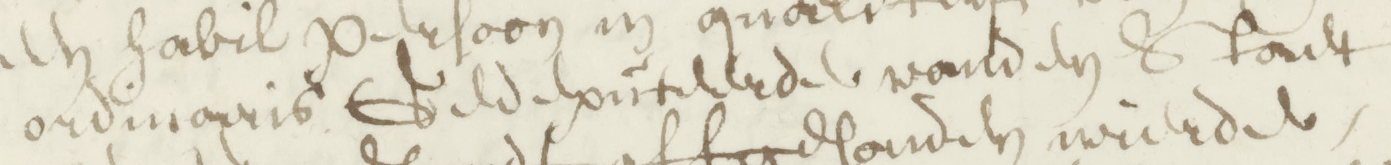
ordinaris Gedeputeerde vanden Staet
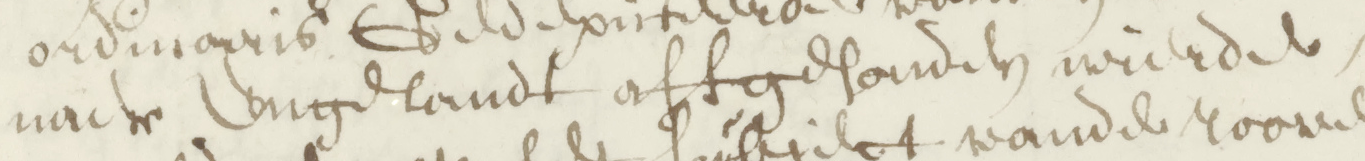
naer Engelandt affgesonden wierde,
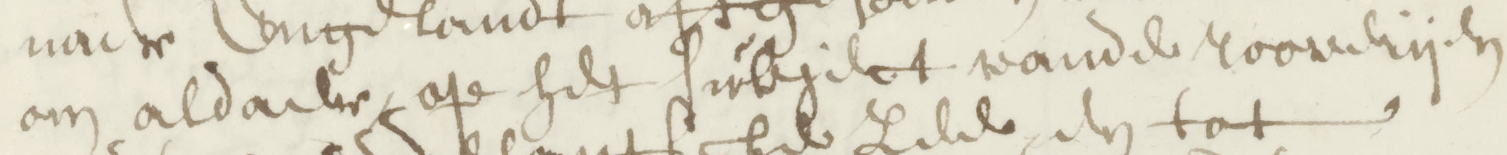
om aldaer op het subject vande rooverijen
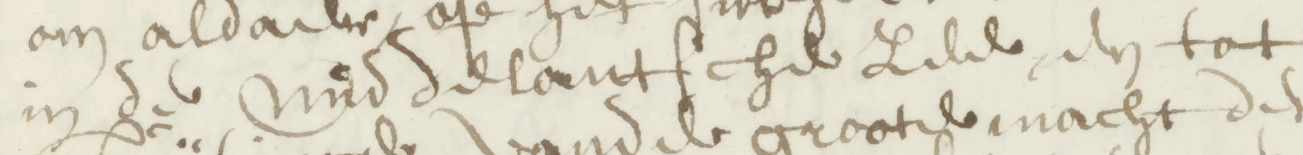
in de Middelantsche Zee, en tot
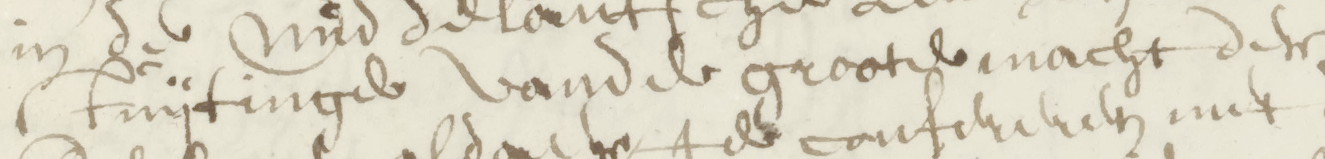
stuijtinge vande groote macht der
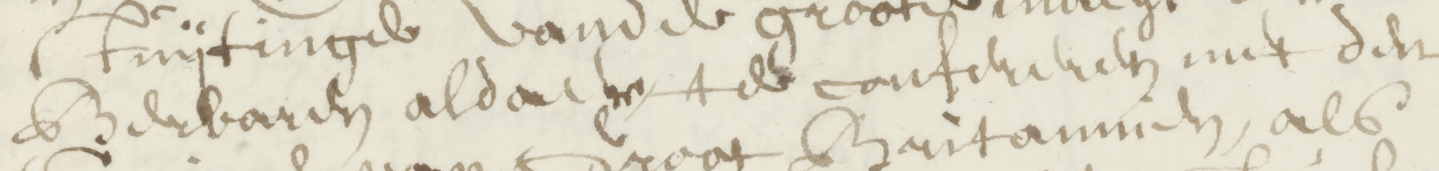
Berbaren aldaer te confereren met den
